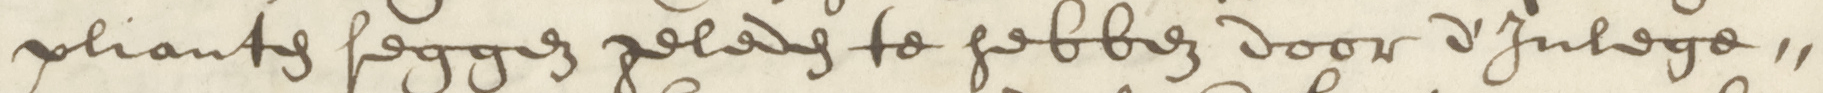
plianten seggen geleden te hebben door d'Inlege„
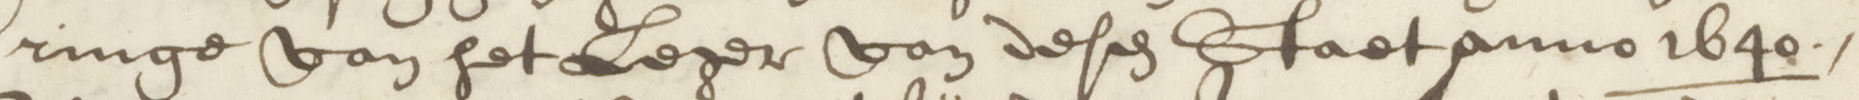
ringe van het Leger van desen Staet anno 1640 ·.
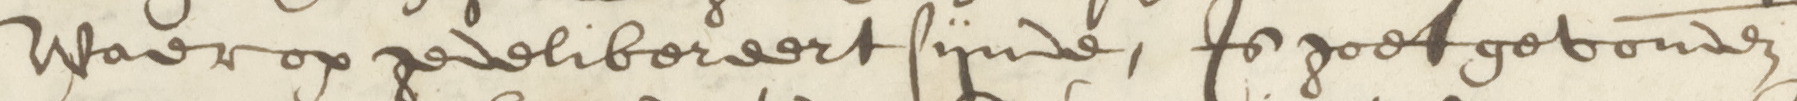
Waerop gedelibereert sijnde, Is goetgevonden
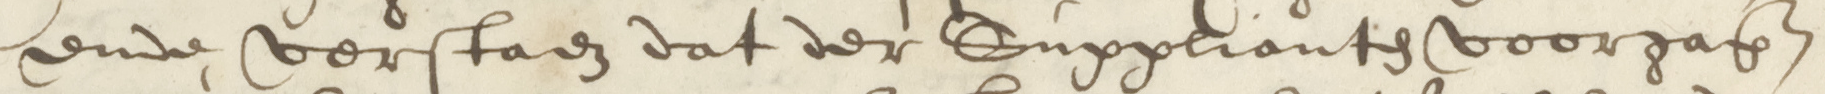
ende verstaen dat der Supplianten voorgaen
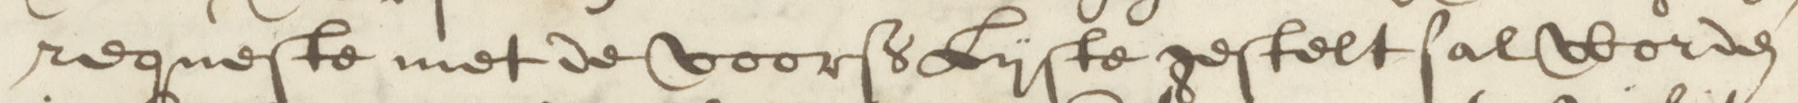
requeste met de voorsz Lijste gestelt sal worden
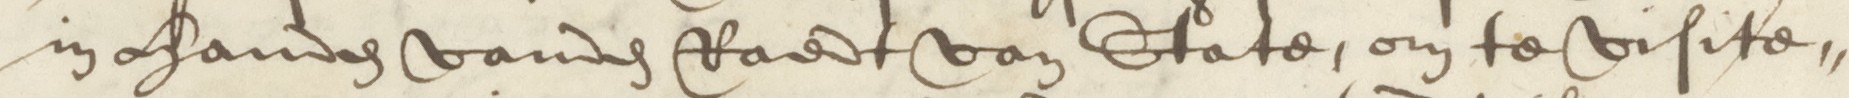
in handen vanden Raedt van State, om te visite„
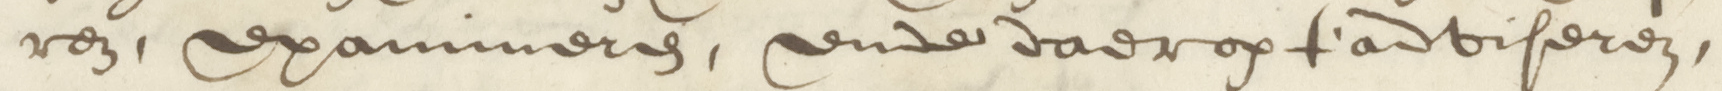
ren, examineren, ende daerop t'adviseren.
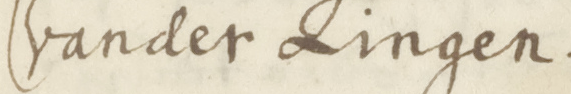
Vander Lingen.
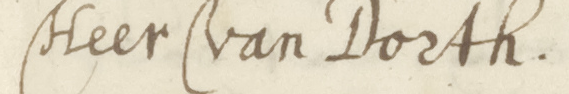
Heer van Dorth.
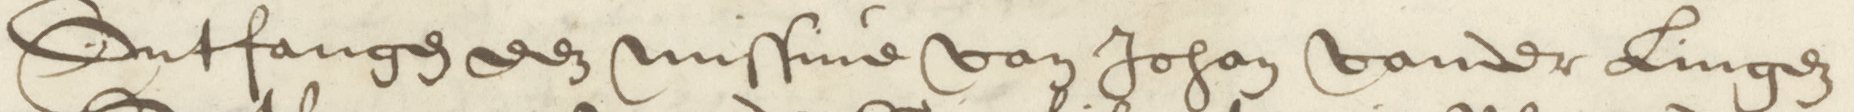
Ontfangen een missive van Johan vander Lingen
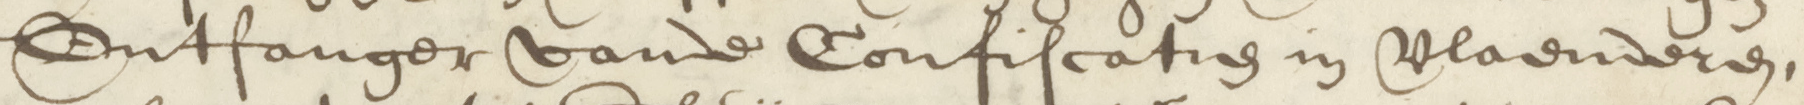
Ontfanger vande Confiscatien in Vlaenderen,
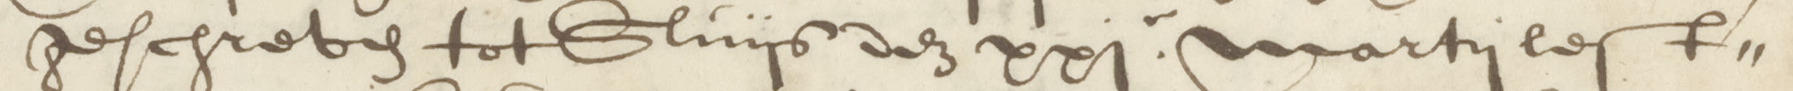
geschreven tot Sluijs den xxie. Martij lest„
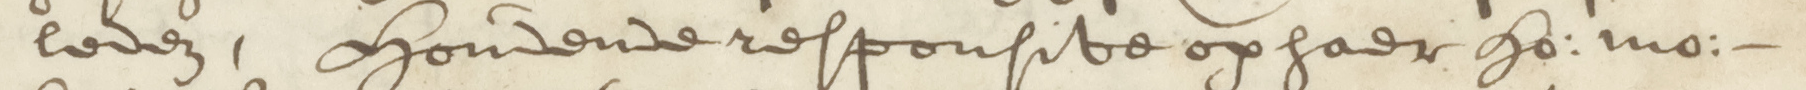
leden, houdende responsive op haer Ho: Mo: -
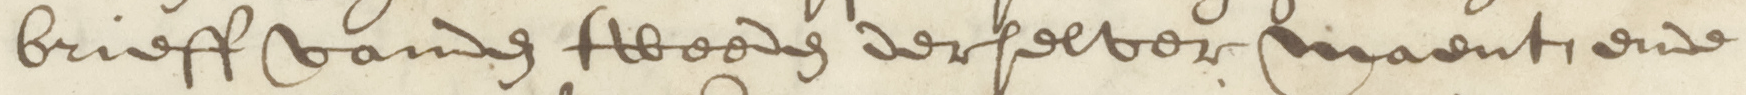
brieff vanden tweeden derselver Maent, ende
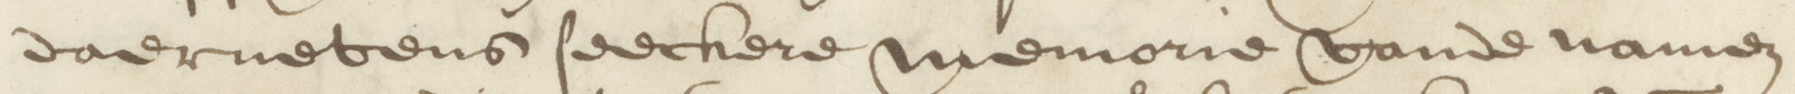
daernevens seeckere memorie vande namen
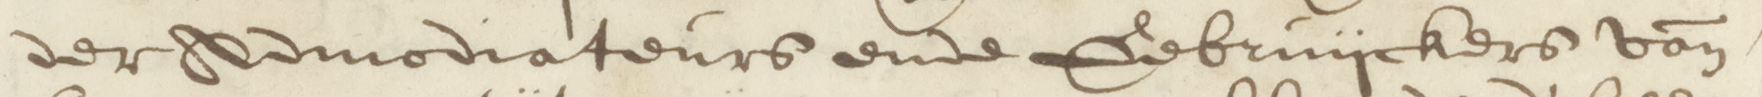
der Admodiateurs ende Gebruijckers van
